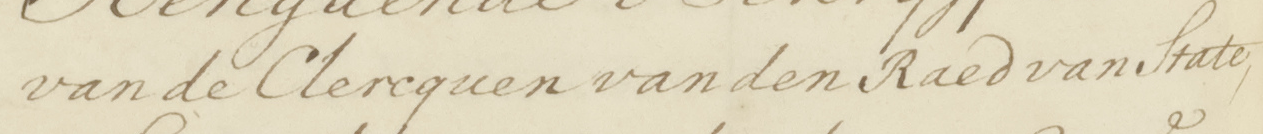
van de Clercquen van den Raed van State,
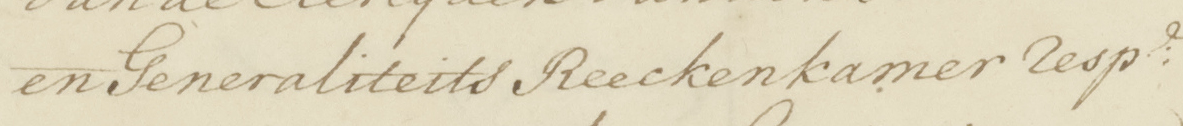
en Generaliteits Reeckenkamer respe:
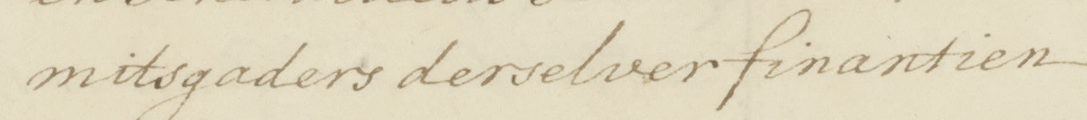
mitsgaders derselver finantien
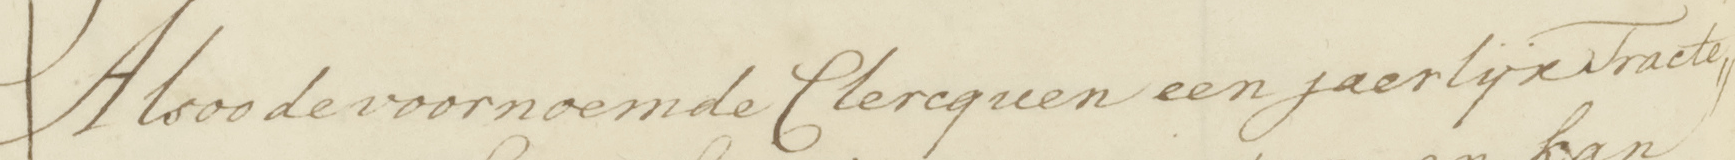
Alsoo de voornoemde Clercquen een jaerlijx Tracte„
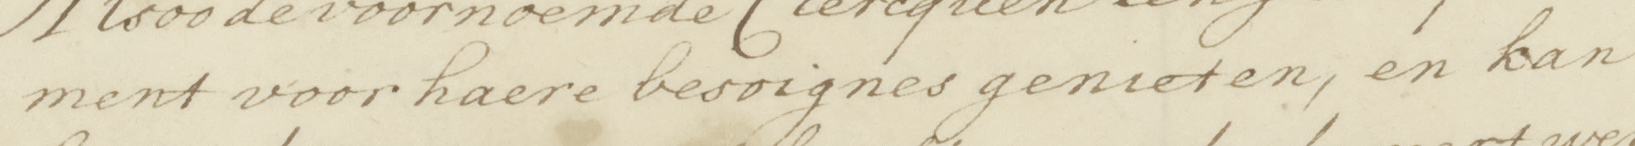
ment voor haere besoignes genieten, en kan
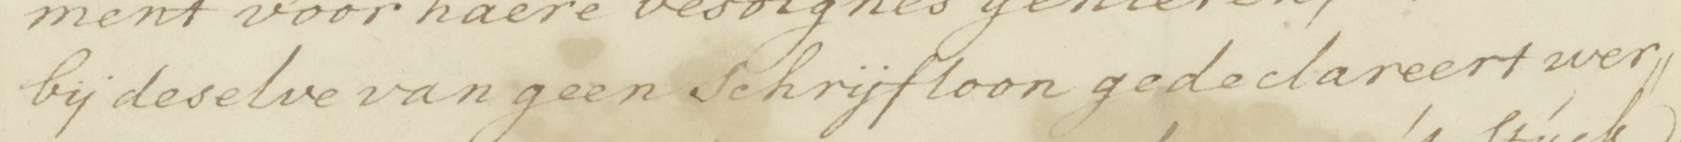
bij deselve van geen Schrijfloon gedeclareert wer„
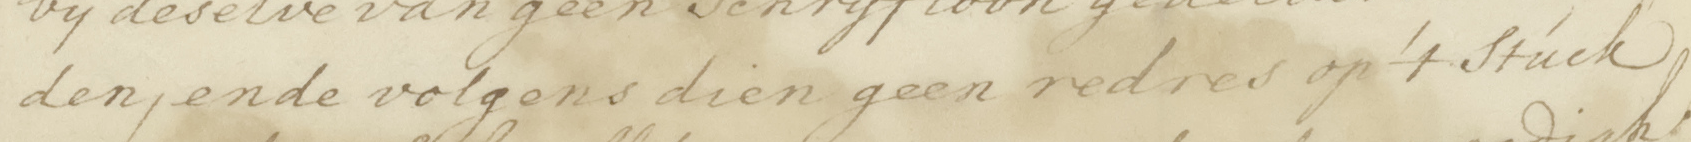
den, ende volgens dien geen redres op 't stuck
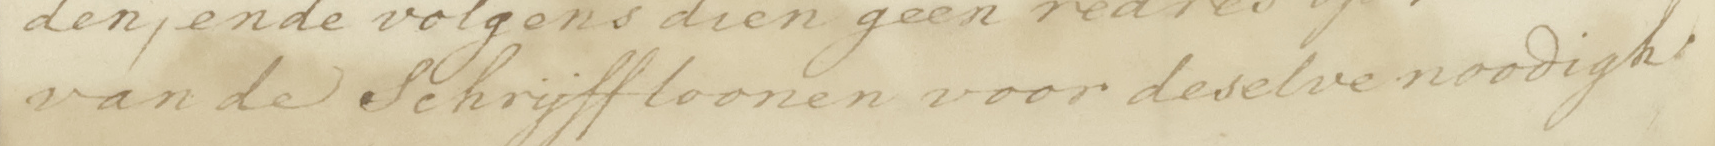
van de Schrijffloonen voor deselve noodigh
